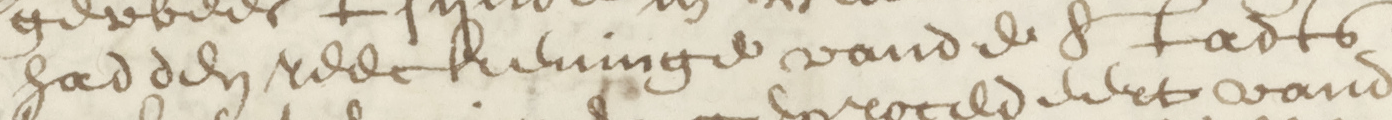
hadden reeckeninge vande Stadts
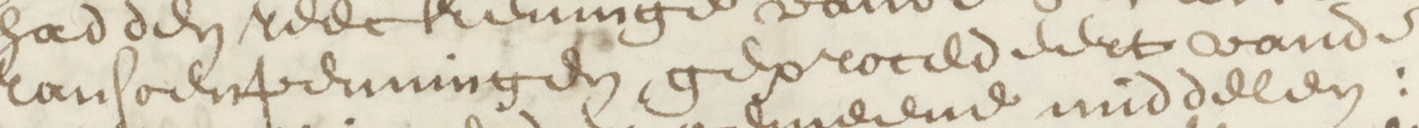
ransoenpenningen, geprocedeert vande
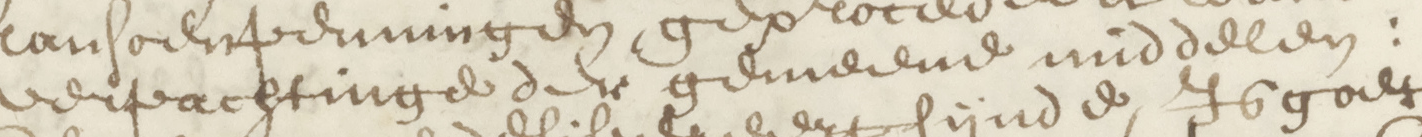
verpachtinge der gemeene middelen:
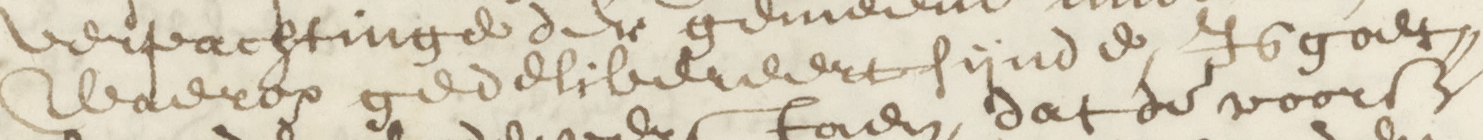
Waerop gedelibereert sijnde, Is goet,,
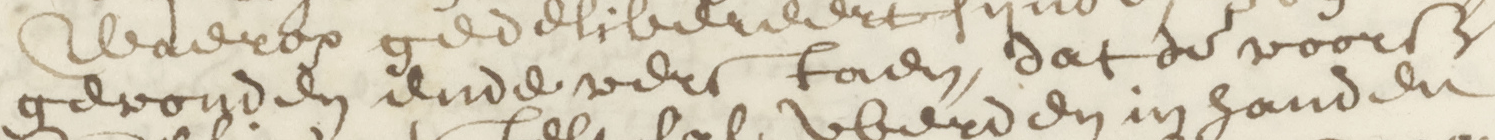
gevonden ende verstaen, dat de voors
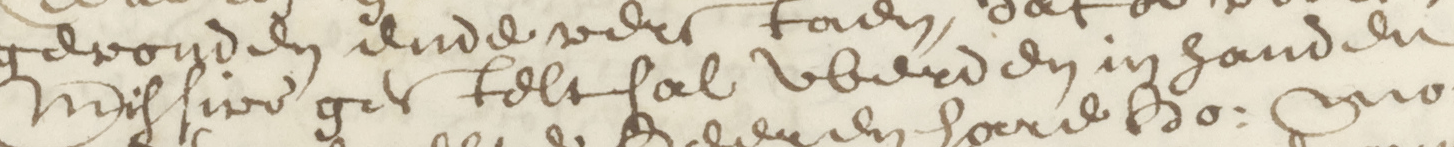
missive gestelt sal werden in handen
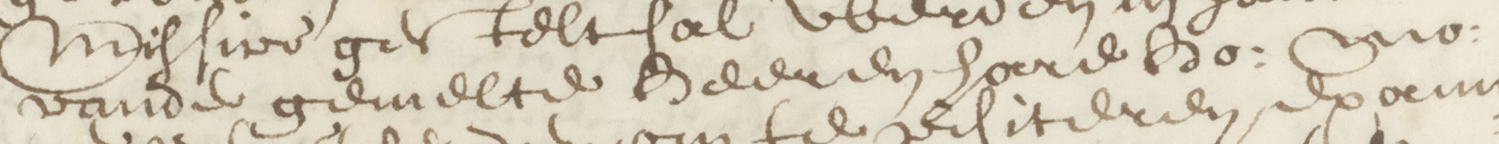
vande gemelte Heeren hare Ho:Mo:
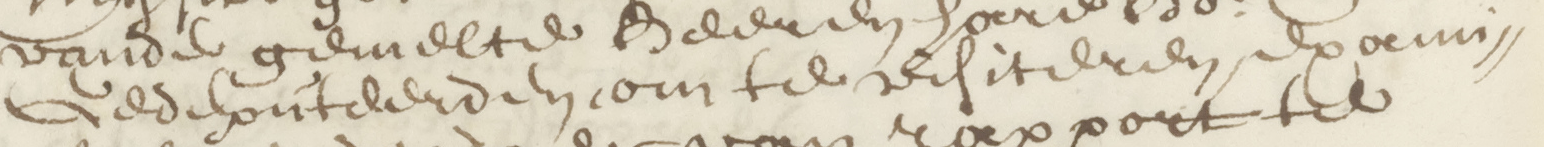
Gedeputeerden, om te visiteren, exami,,
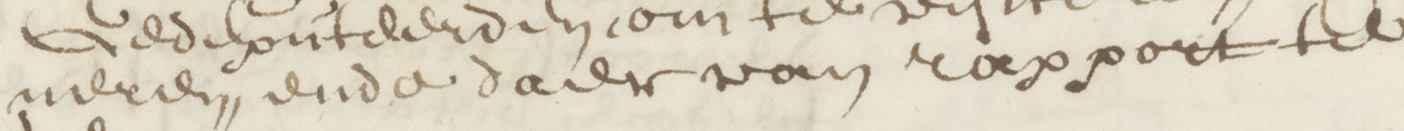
neren, ende daer van rapport te
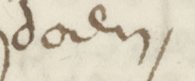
doen.
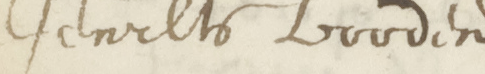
Genrlts booden
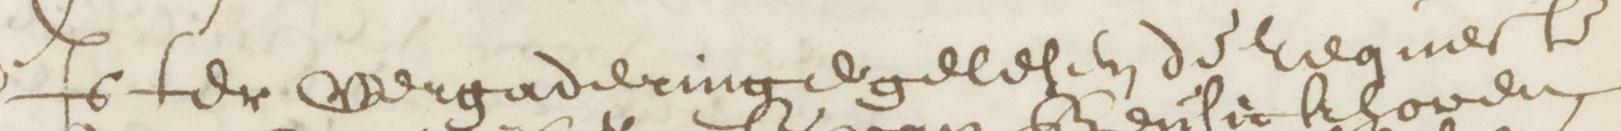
Is ter vergaderinge gelesen de requeste
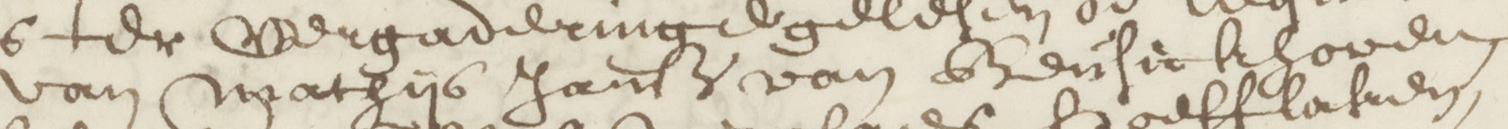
van mathijs Jansz van Beusickhoven,
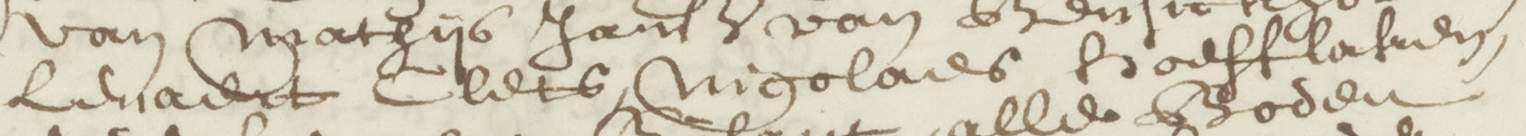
Lenaert Clets, Nicolaes Hoefflaken,
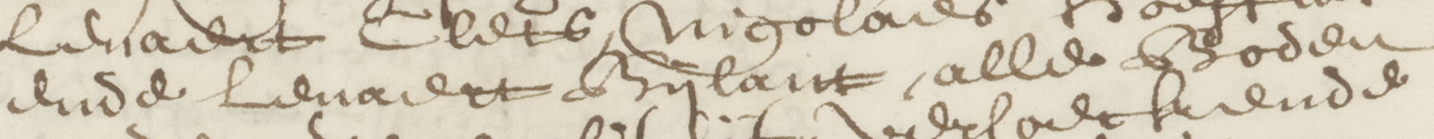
ende Lenaert Bijlant, alle Boden
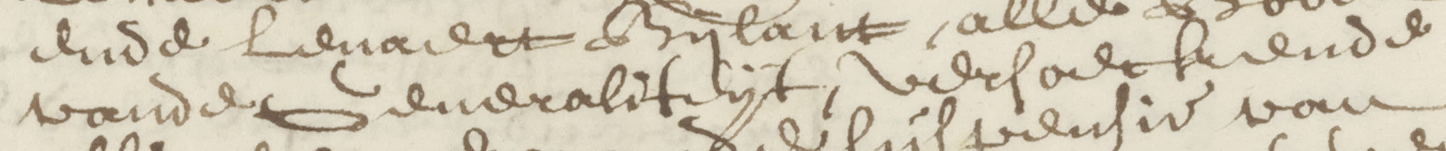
vande Generaliteijt, versoeckende
